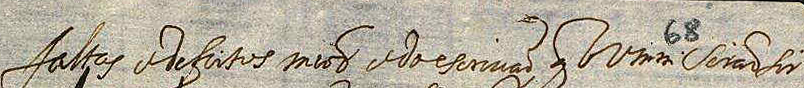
faltas e defeitos meos e do escriuão, q̄ VV mm seraõ sir
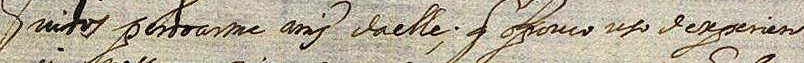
uidos perdoarme a mj̄ e a elle; q̄ o pouco uso e experien
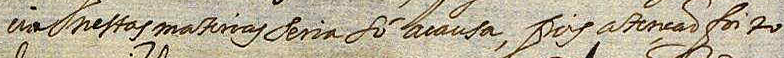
cia nestas materias seria só a causa, pois a tenção foi to
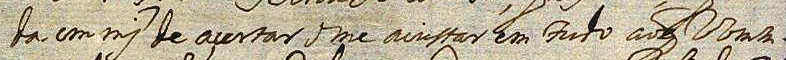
da em mj̄ de acertar e me aiustar em tudo ao q̄ Vv mm.
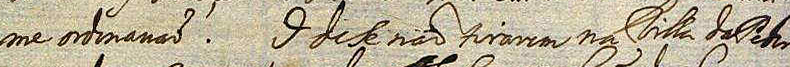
me ordenauaõ. E de se naõ tirarem na Villa da Peder
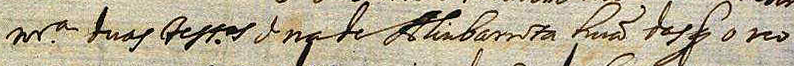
nr.a duas test.as e na de Aliubarrota huā das q̄ o reo
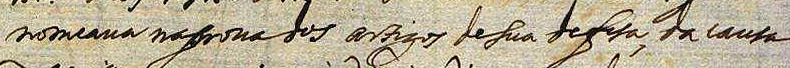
nomeaua na proua dos artigos de sua defesa, da causa
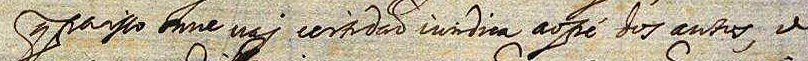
q̄ pa isso ouue uaj certidaõ iuridica ao pé dos autos, e
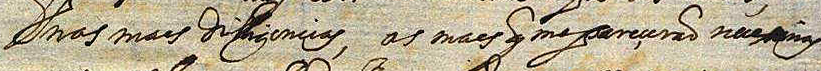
nas mais dilligencias, as maes q̄ me pareceraõ necessarias
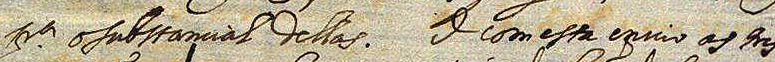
p.a o substancial dellas. E com esta enuio as tres
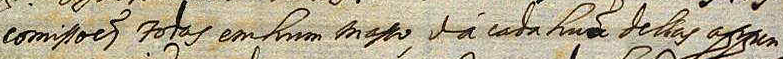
comissoẽs todas em hum masso, e a cada huā dellas appen
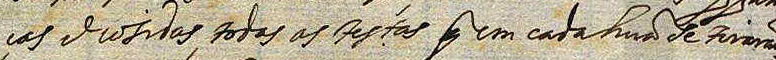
ças e cosidas, todas as testas q̄ em cada huā se tiraraõ
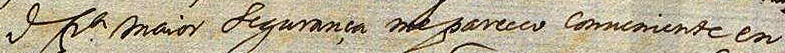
e p.a maior segurança me pareceo conueniente en
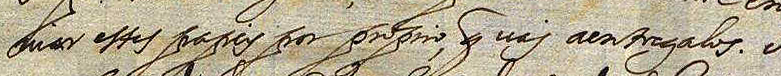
uiar estes papeis por proprio, q̄ uaj a entregalos. e
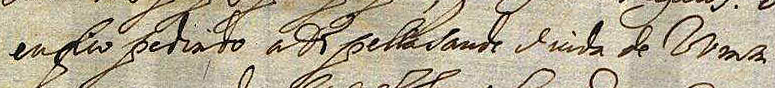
eu fico pedindo a Ds̄ pella saude e uida de Vv mm.
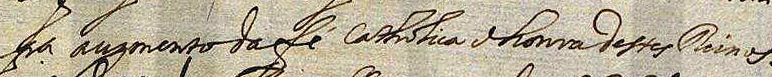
p.a augmento da fé catholica e honra destes Reinos.
